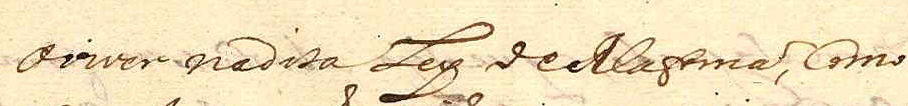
O viver na dita Ley de Mafoma, Como
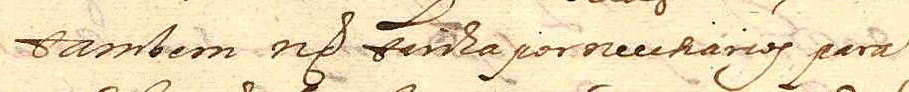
tambem naõ tinha por necessarios para
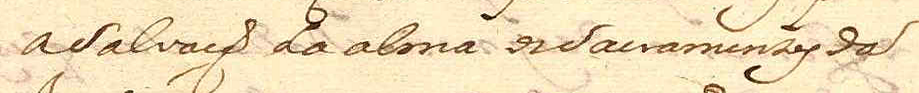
a salvaçaõ da alma os sacramentos da
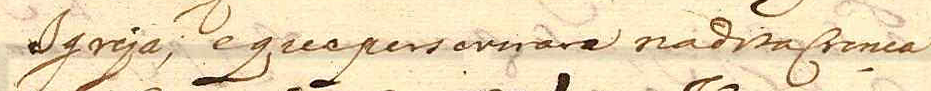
Igreja, e que perseverara na dita Crença
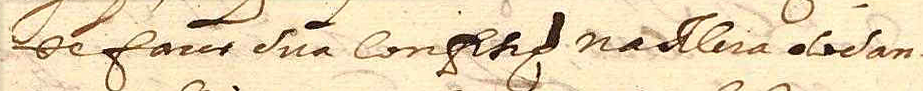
te fazer sua confissaõ na Meza do san
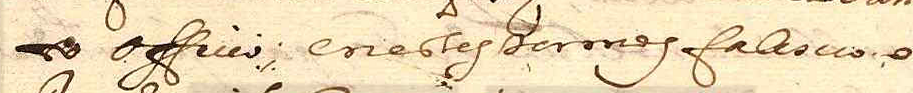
to officio; e nestes termos falesceo o
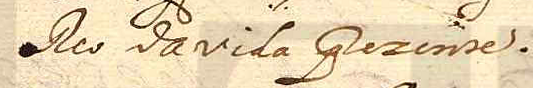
Reo da vida pRezente.
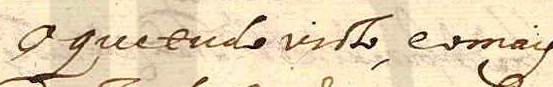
O que tudo visto, e o mais
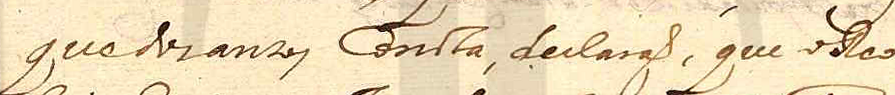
que dos autos Consta, declaraõ, que o Reo
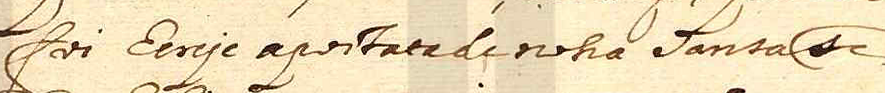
foi hereje apostata de nossa Santa Fe
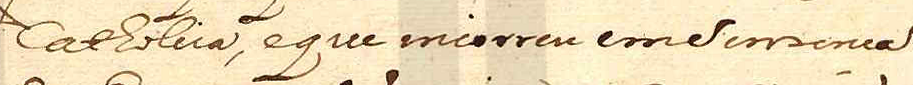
Catholica, e que incorreu em sentença
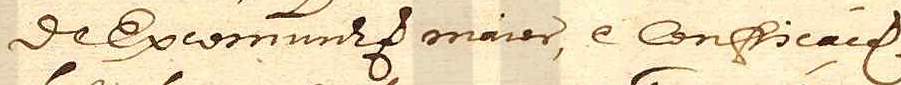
de Excomunhaõ maior, e Confiscaçaõ
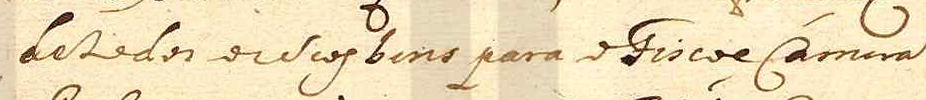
de todos os seos bens para o Fisco, e Camera
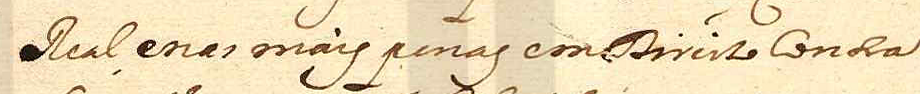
Real, e nas mais penas em Direito Contra
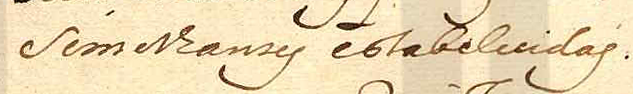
semelhantes estabelecidas.
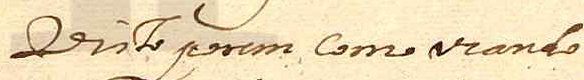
Visto porem como vzando
